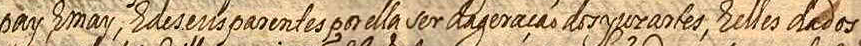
pay, E may, E de seus parentes por ella ser da geração dos yuzartes, E elles da dos
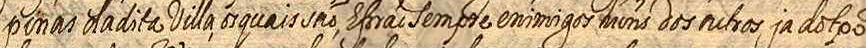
pinas da dita Villa, os quais são, E forão sempre enimigos hun̄s dos outros ja do tpō
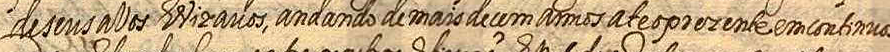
de seus avos E vizauos, andando de mais de cem annos ate o prezente em continuos
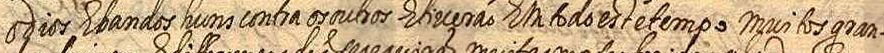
odios E bandos huns contra os outros E tiuerão Em todo erte tempo muitos gran
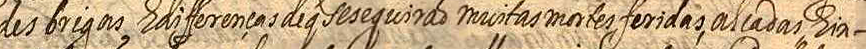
des brigas E differenças de q̄ se seguirão muitas mortes, feridas, alçadas, E in
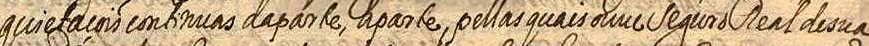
quietaçõis continuas da parte, a parte, pellas quais ouue seguro Real de sua
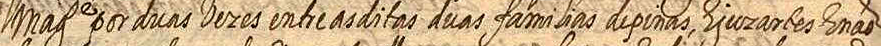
Magde por duas vezes entre as ditas duas familias de pinas, E juzartes E não
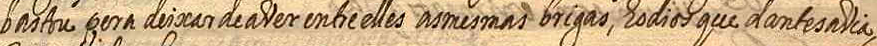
bastou pera deixar de aver entre elles as mesmas brigas, E odios que dantes avia
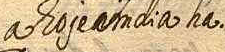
E oje em dia ha.
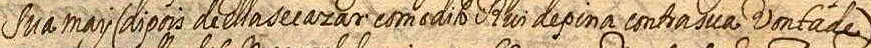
sua may (dipois de ella se cazar com o dito Rui de pina contra sua Vontade)
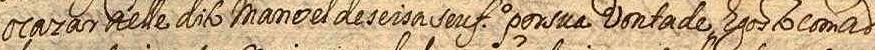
o cazar a elle dito manoel de seisa seu f.o por sua Vontade E gosto com a d.
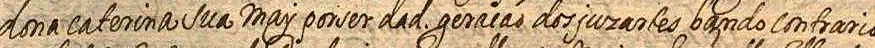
dona caterina sua may por ser da d. geração dos juzartes bando contrario
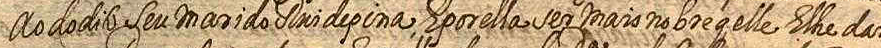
ao do dito seu marido Rui de pina, E por ella ser mais nobre q̄ elle E lhe dar
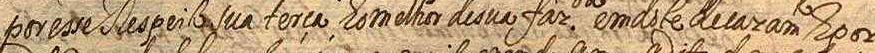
por esse Respeito sua terça, E o melhor de sua faz.da em dote de cazamto E por
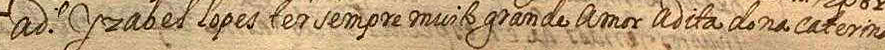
a d.a Yzabel lopes ter sempre muito grande amor a dita dona caterina
